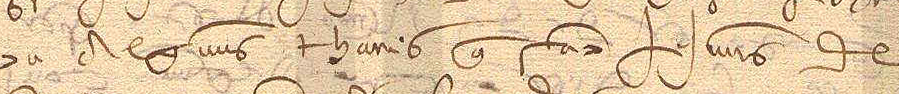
ou Algūus thanis q̄ são JeJūus de
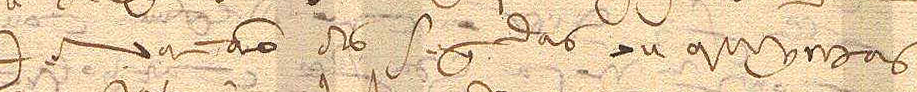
devoçaõ As seḡdas ou quyntas
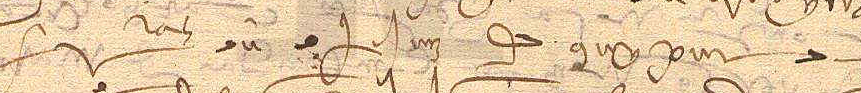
frras ou o JeJum do quypur ou
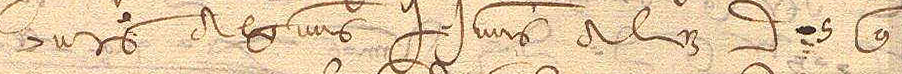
outso Alguūs JeJūus Alem dos q̄
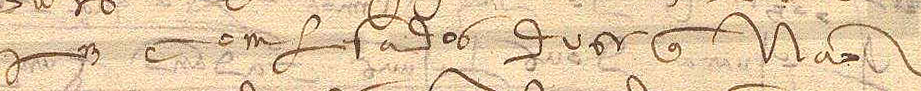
tem comfesados dise q̄ Naõ
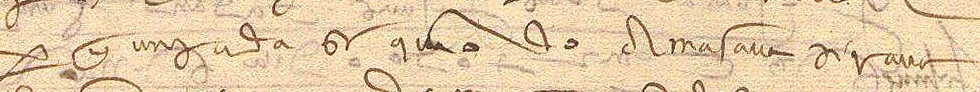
ꝑguntada se quãodo Amasaua tiraua
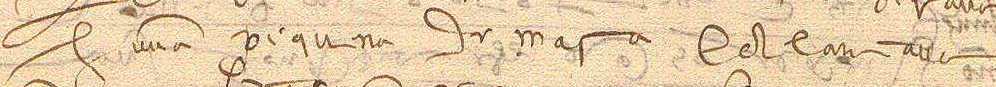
huūa pequena de masa e A lancaua
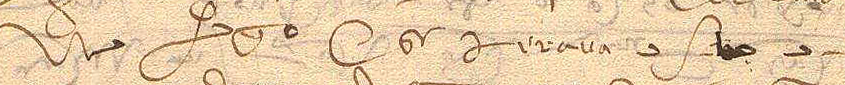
No fogo e se tiraua o sebo ou
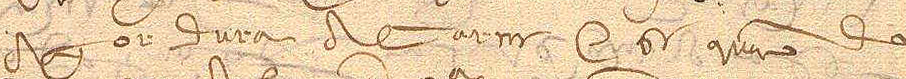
A gordura A Carne E se quãodo
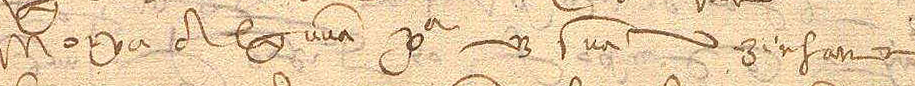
Morya Alguūa pa en sua vezinhanca
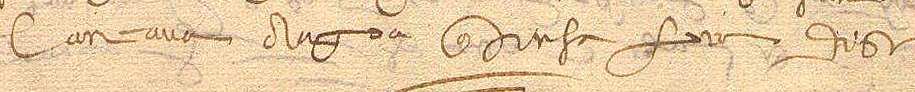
lancaua A agoa q̄ tinha fora dise
